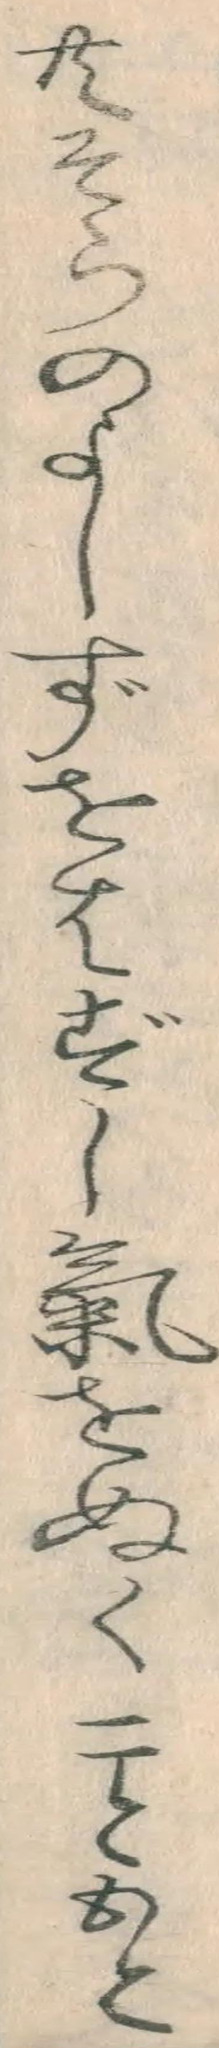共そらのよしずをはずし気をぬくこともと

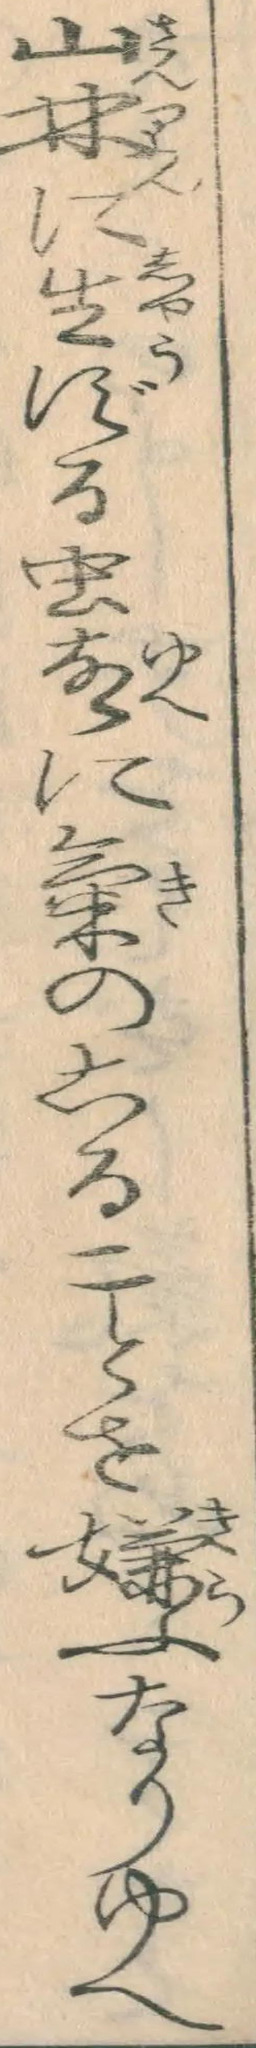山林に生ずる虫故に気のこることを嫌ふなりゆへ
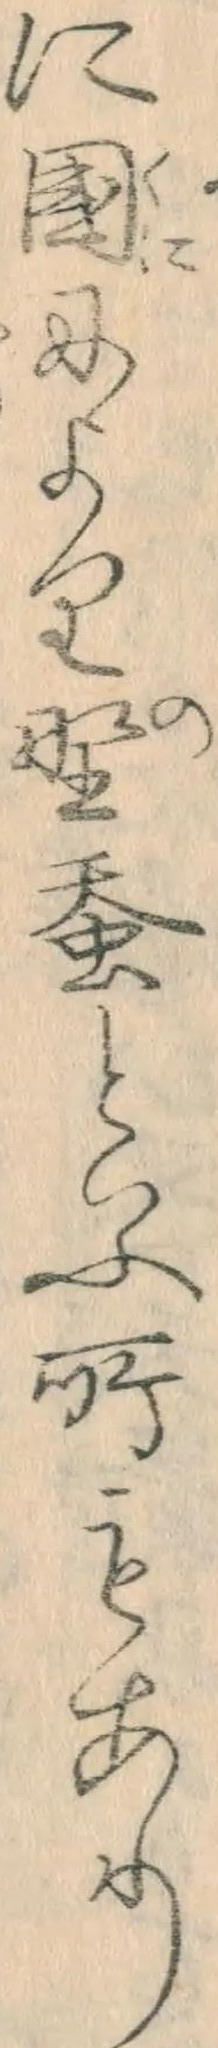に国により野蚕といふ所もあり
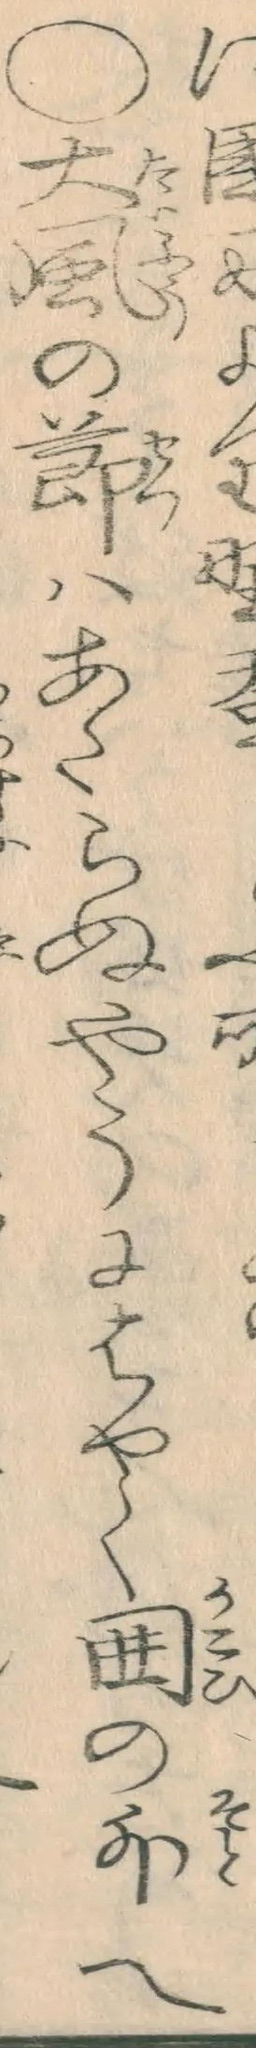○大風の節はあたらぬやうにはやく囲の外へ
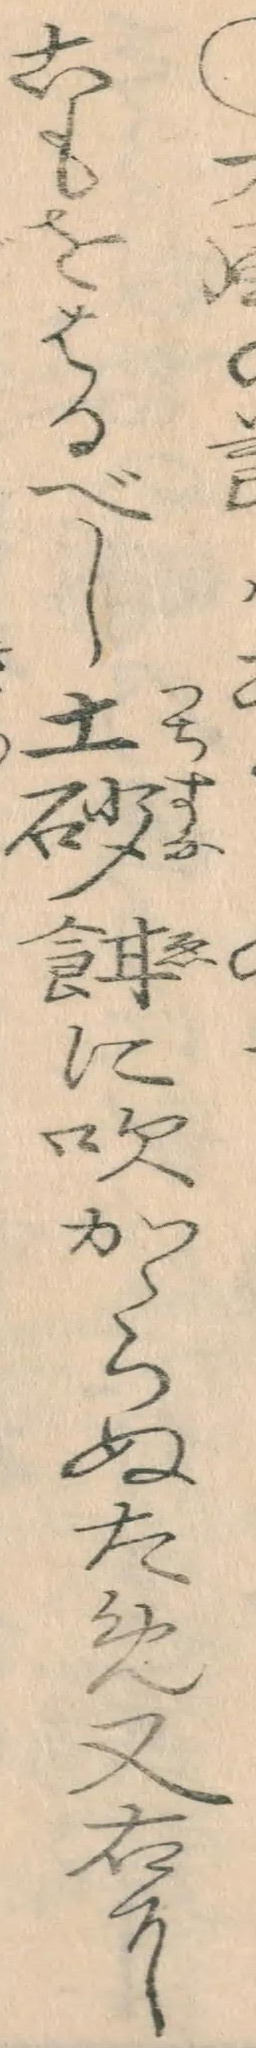こもをはるべし土砂餌に吹かゝらぬため又右に
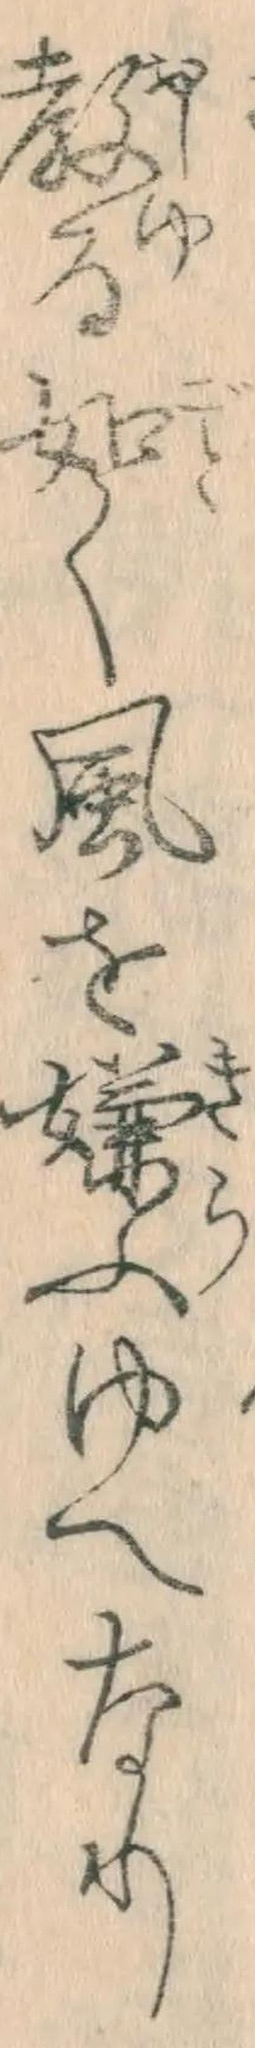教る如く風を嫌ふゆへなり
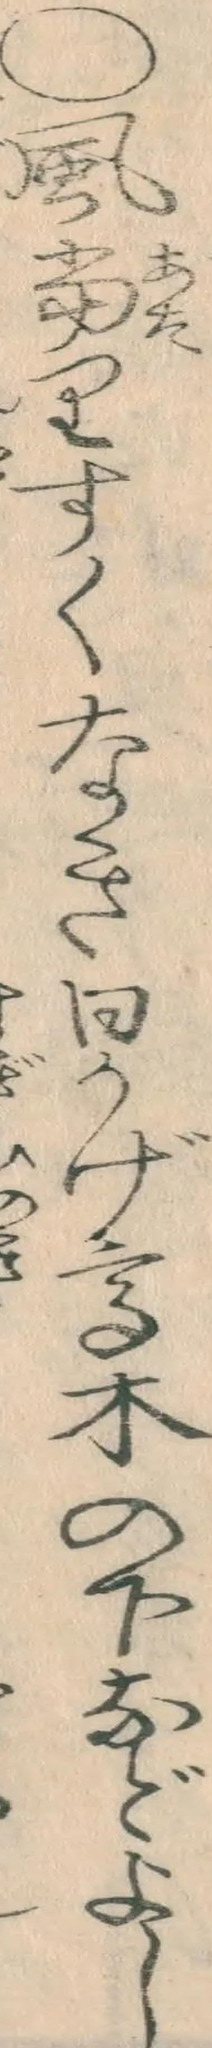○風当りすくなき日かげ高木の下などよし
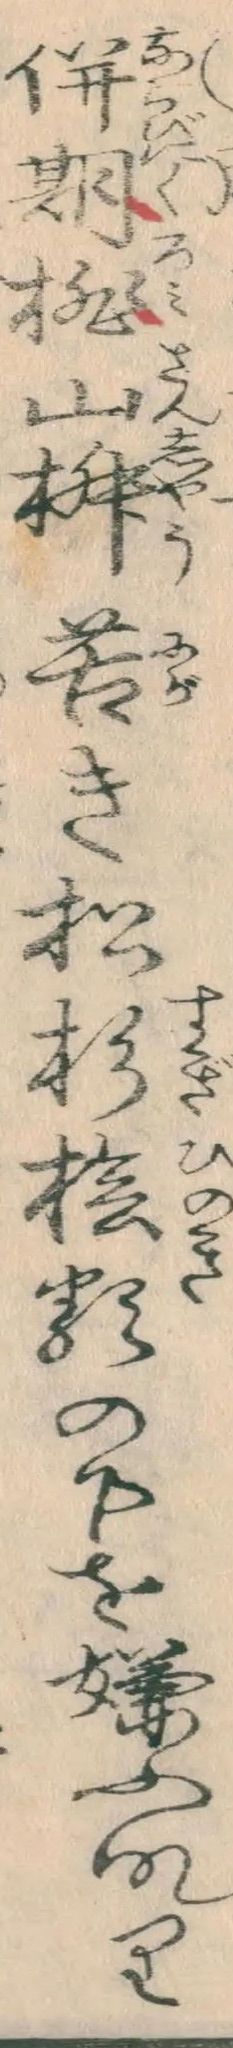并期桃山椒若き松杉桧類の下を嫌ふなり
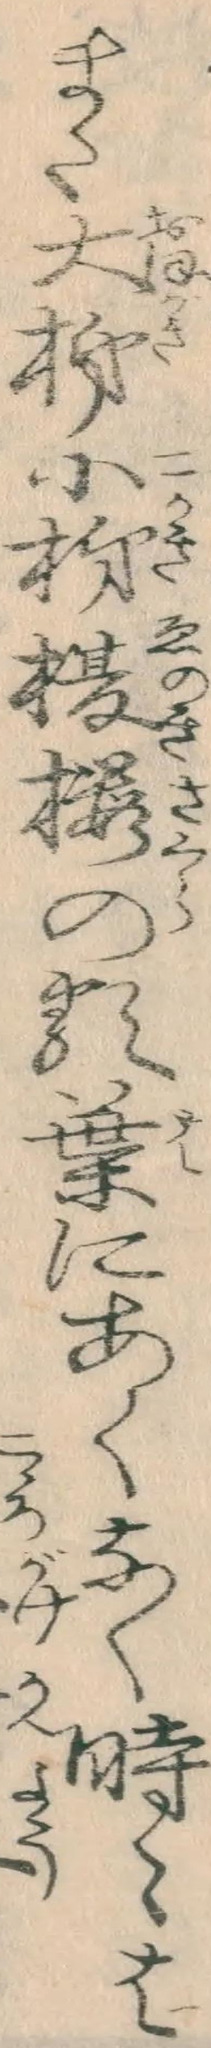また大柿小柿榎桜の類葉にあくなく時々は
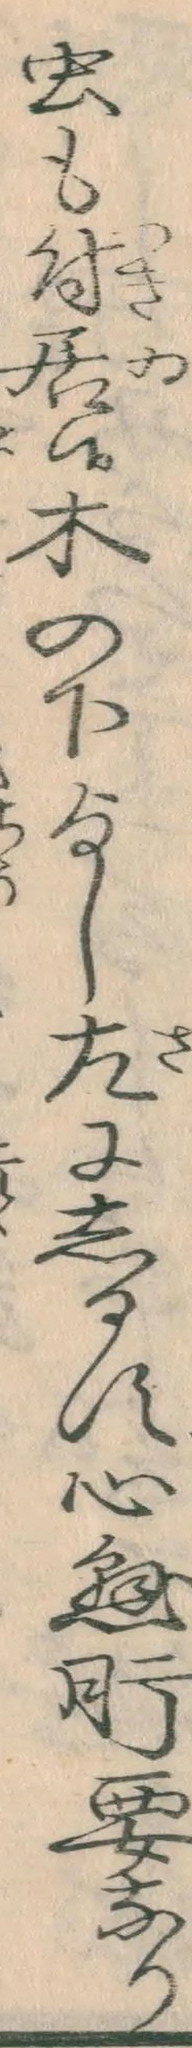虫も付居候気の下よし左にしるす心懸肝要なり
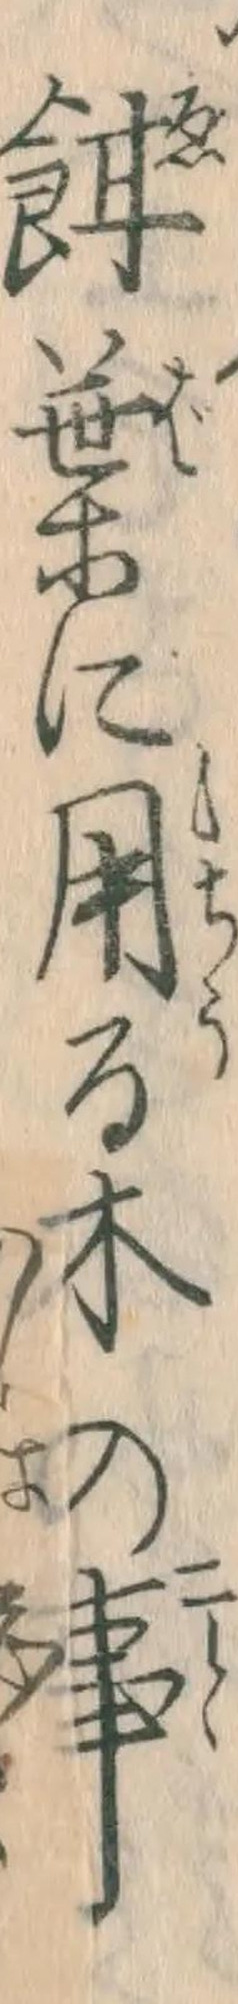飼葉に用る木の事
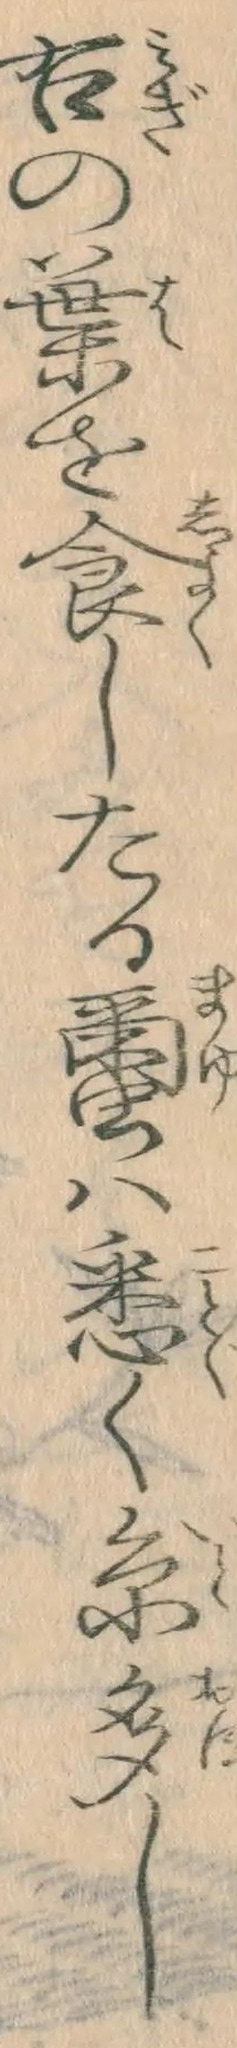右の葉を食したる繭は悉く糸多し
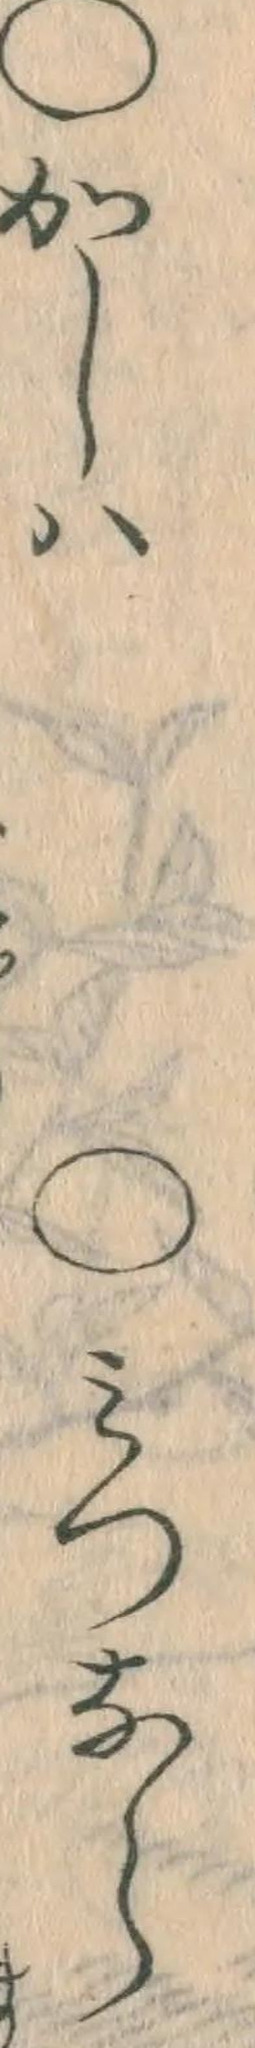○かしは○みつなら
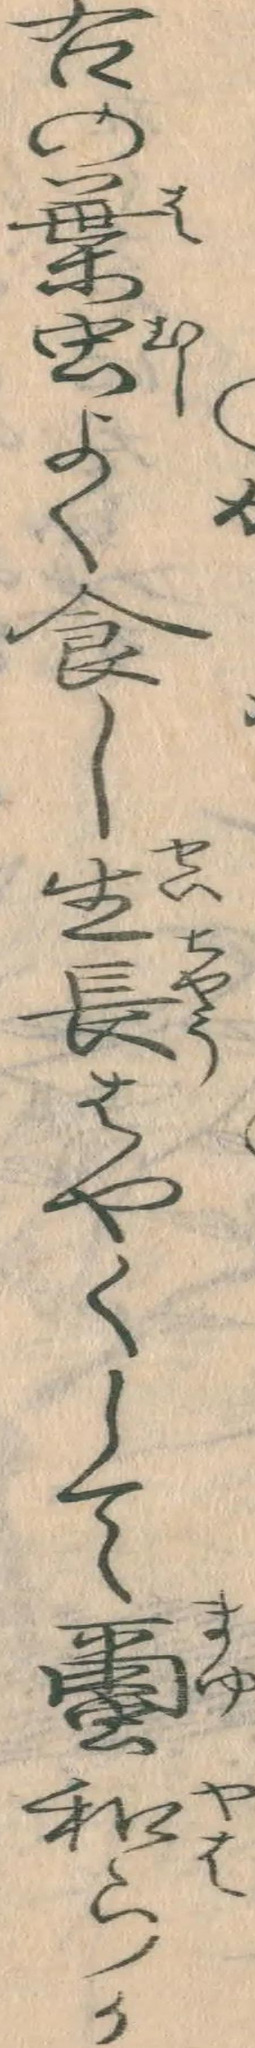右の葉虫よく食し生長はやくして繭和らか
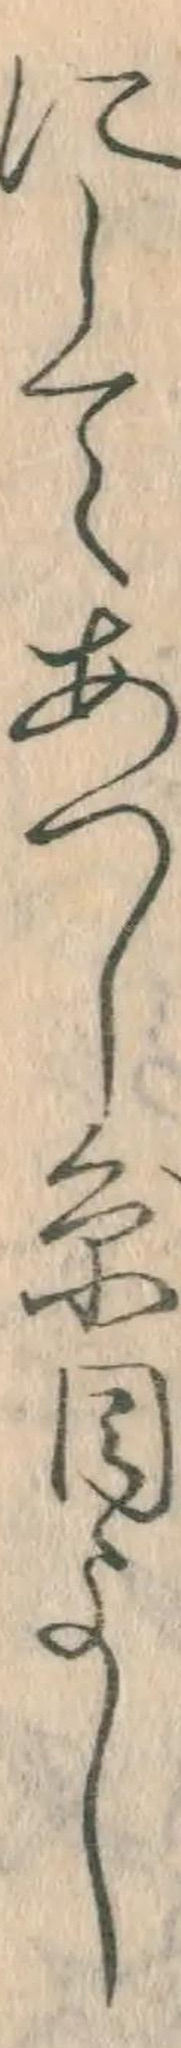にしてあつし糸目よし
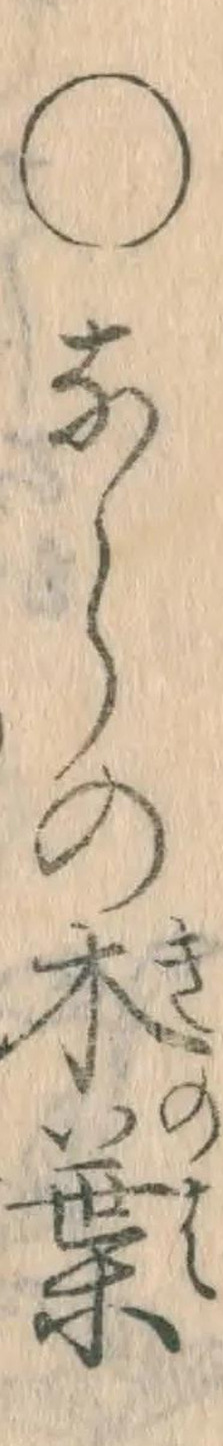○ならの木葉
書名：山繭養法秘傳抄
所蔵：国立国会図書館 National Diet Library, JAPAN
